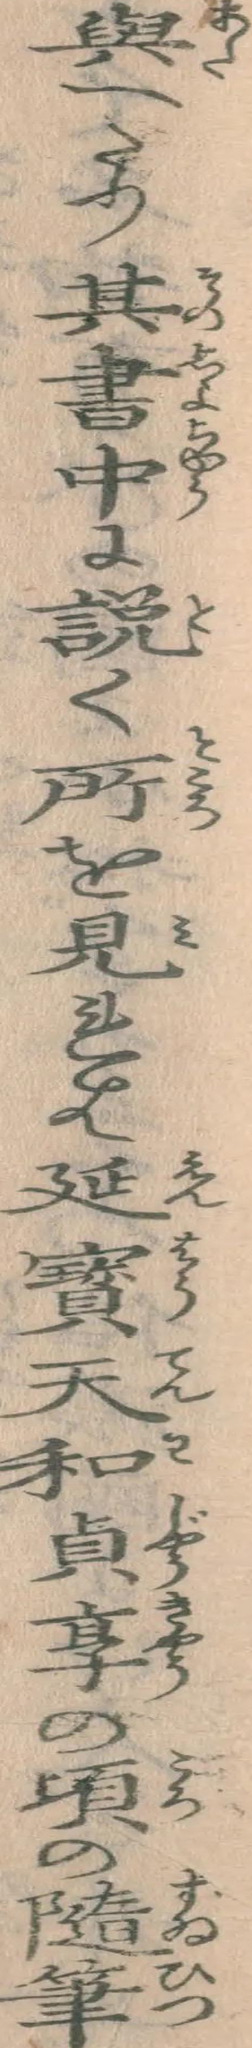与へたり其書中に説く所を見れは延宝天和貞享の頃の随筆
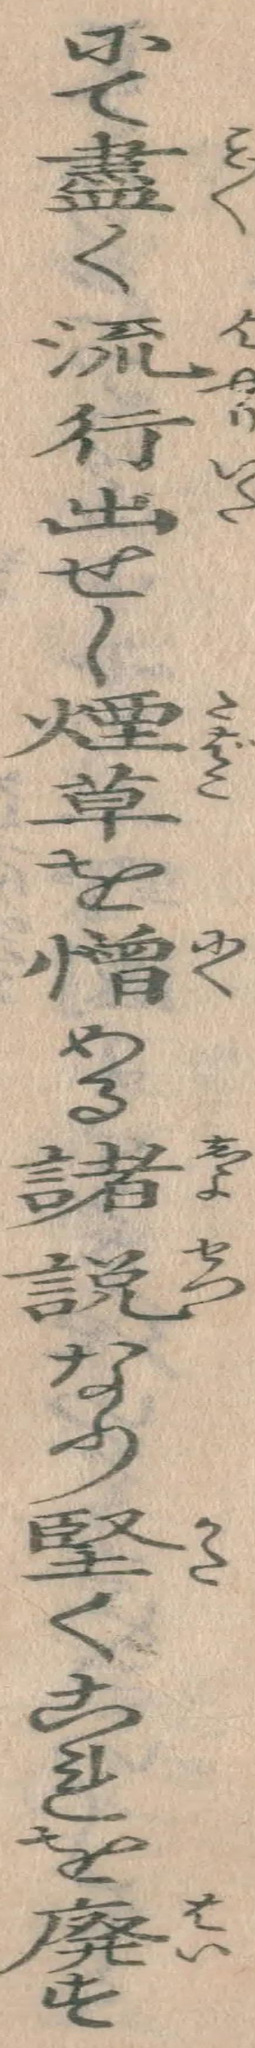にて尽く流行出せし煙草を憎める諸説なり堅くこれを廃す
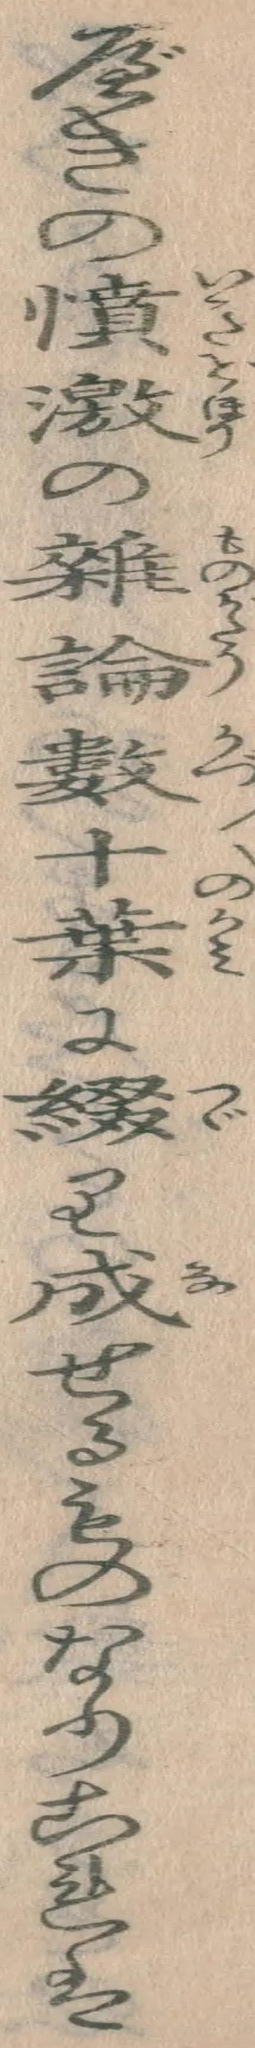べきの憤激の雑論数十葉に綴り成せるものなりこれは
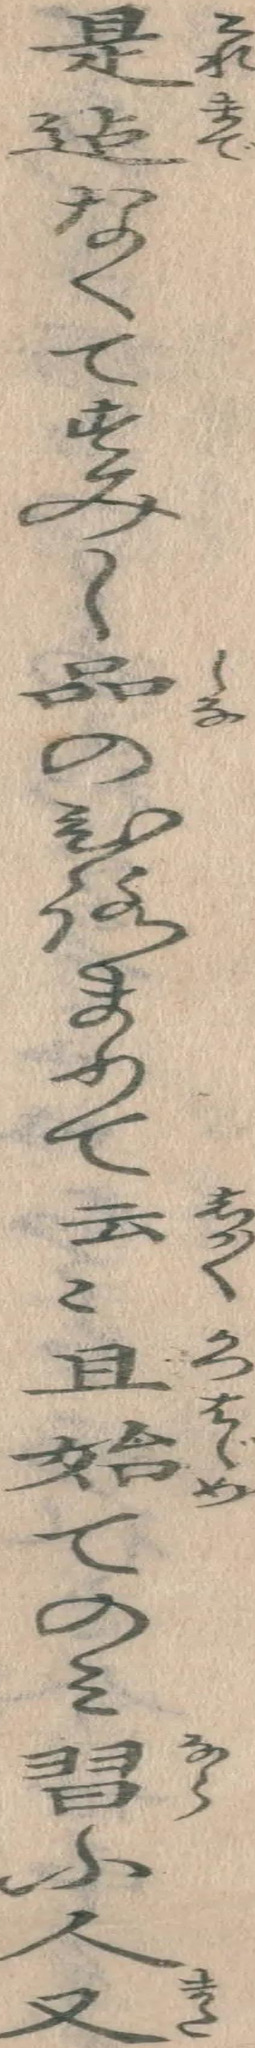是迠なくてすみし品のひろまりて云々且始てのみ習ふ人又
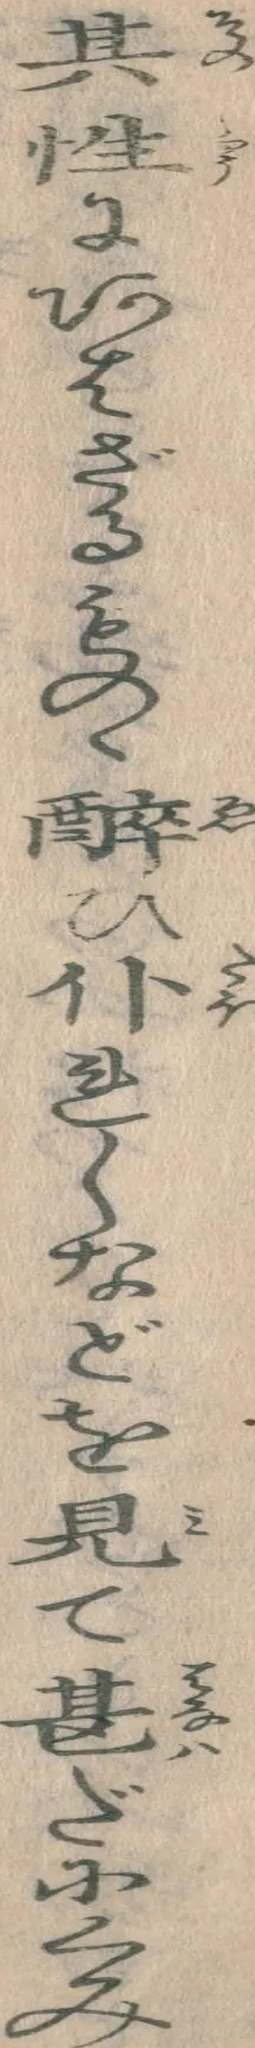其性にあはざるものゝ酔ひ仆れしなどを見て甚だにくみ
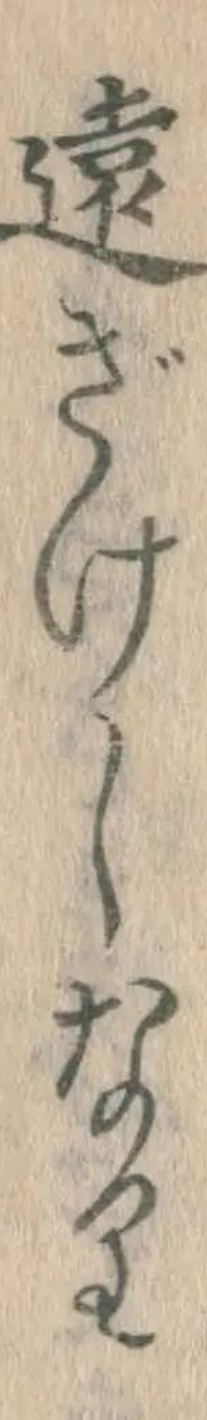遠ざけしなり
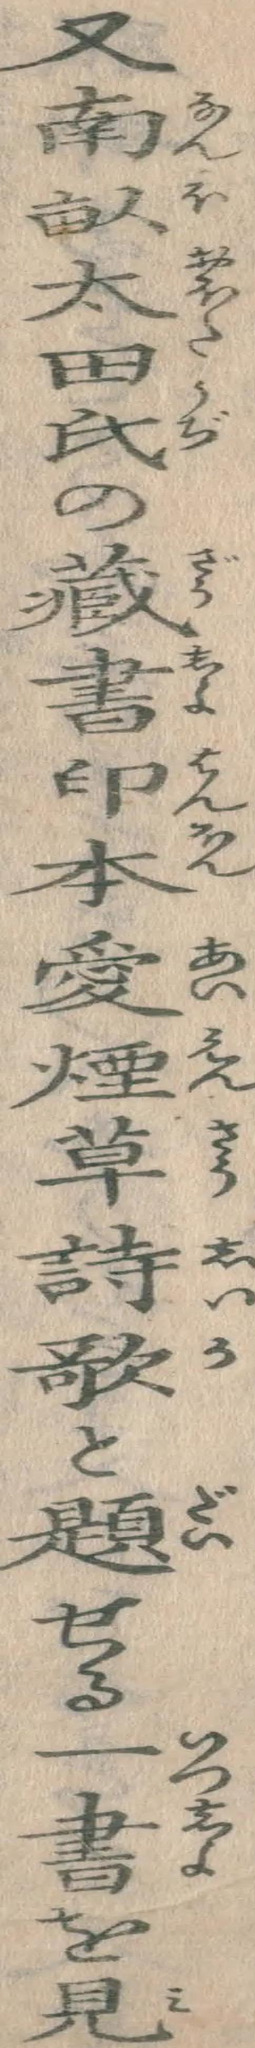又南畝太田氏の蔵書印本愛煙草詩歌と題せる一書を見
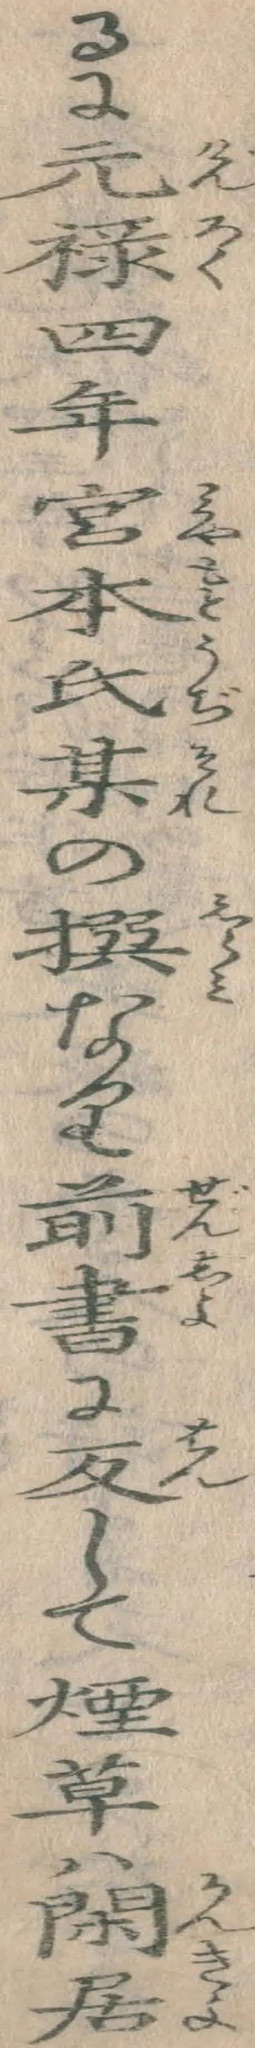るに元禄四年宮本氏某の撰なり前書に反して煙草は閑居
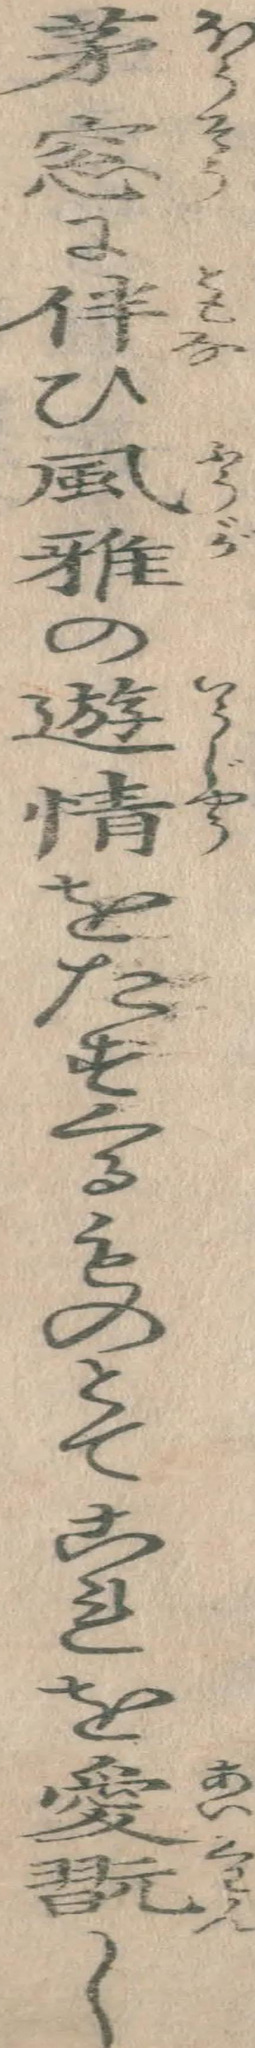茅窓に伴ひ風雅の遊情をたすくるものとてこれを愛翫し
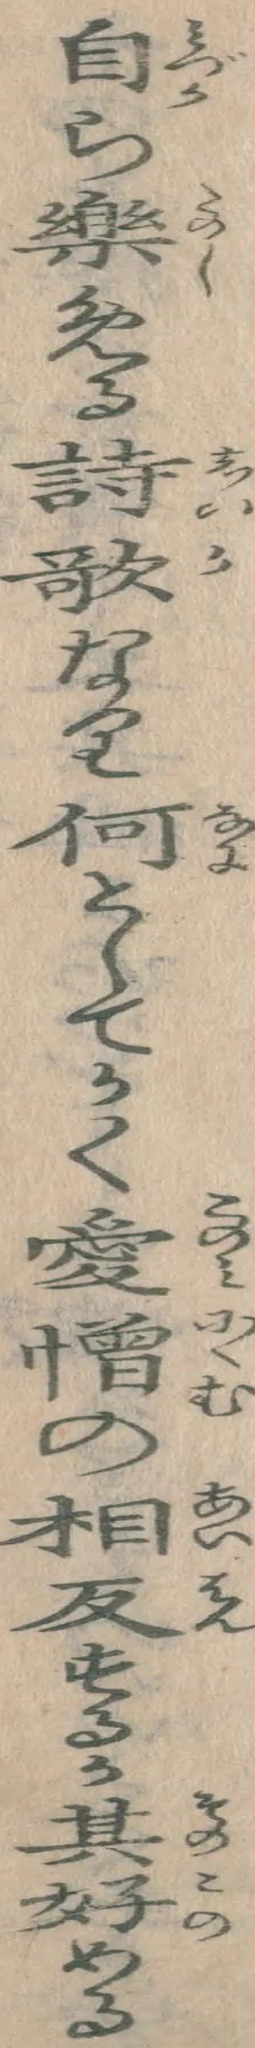自ら楽める詩歌なり何としてかく愛憎の相反するか其好める

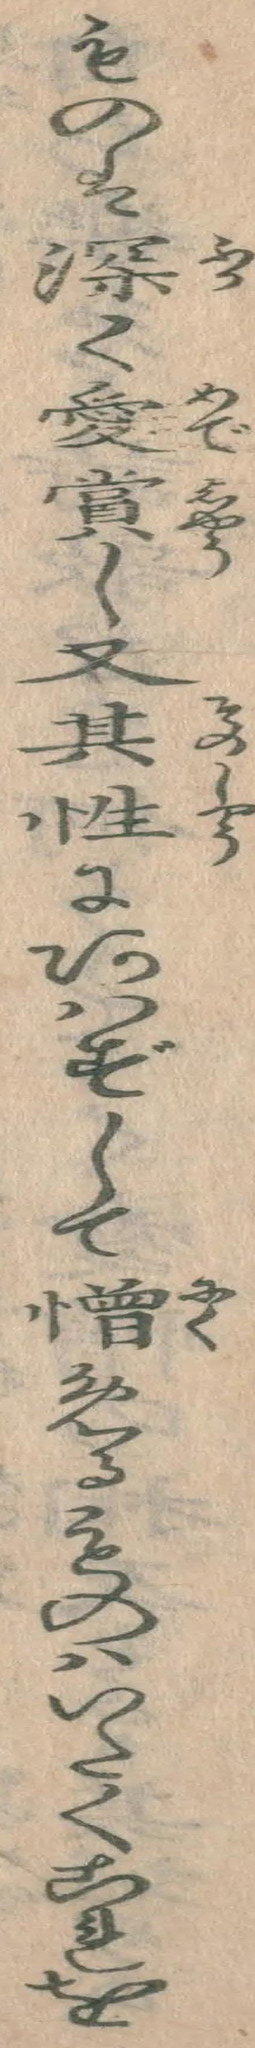ものは深く愛賞し又其性にあはずして憎めるものはいたくこれを
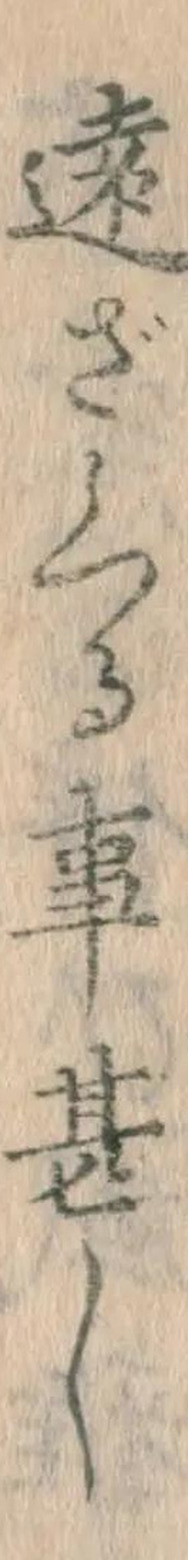遠ざくる事甚し
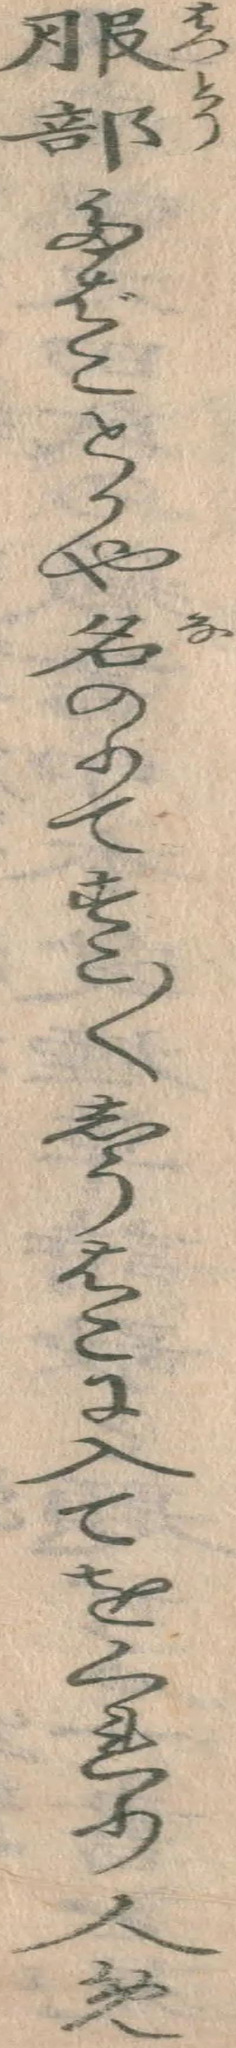服部たばことかや名のりてすこ〳〵しうはこに入てをくれり人め
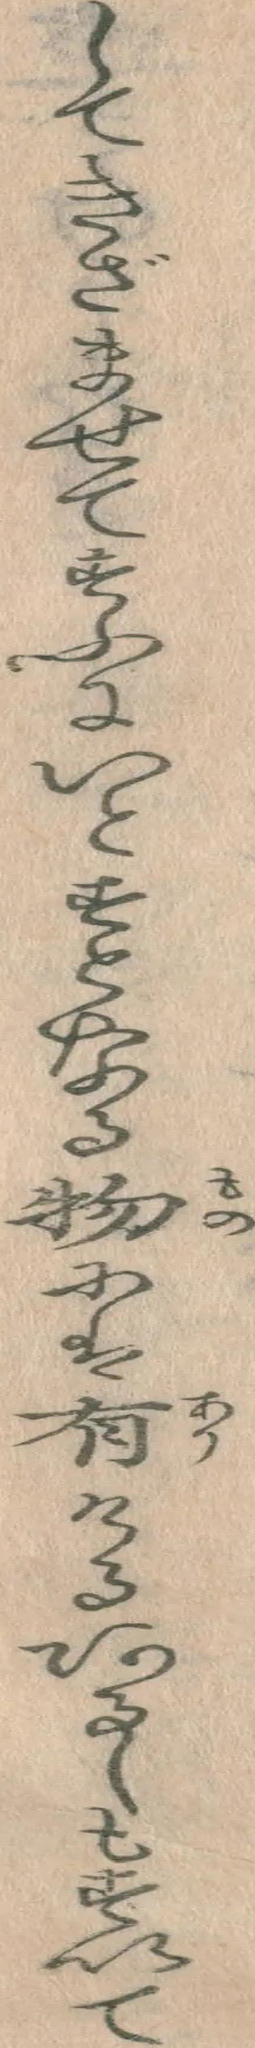してきざませてすふにいとすとなる物には有けるあるしもすいて
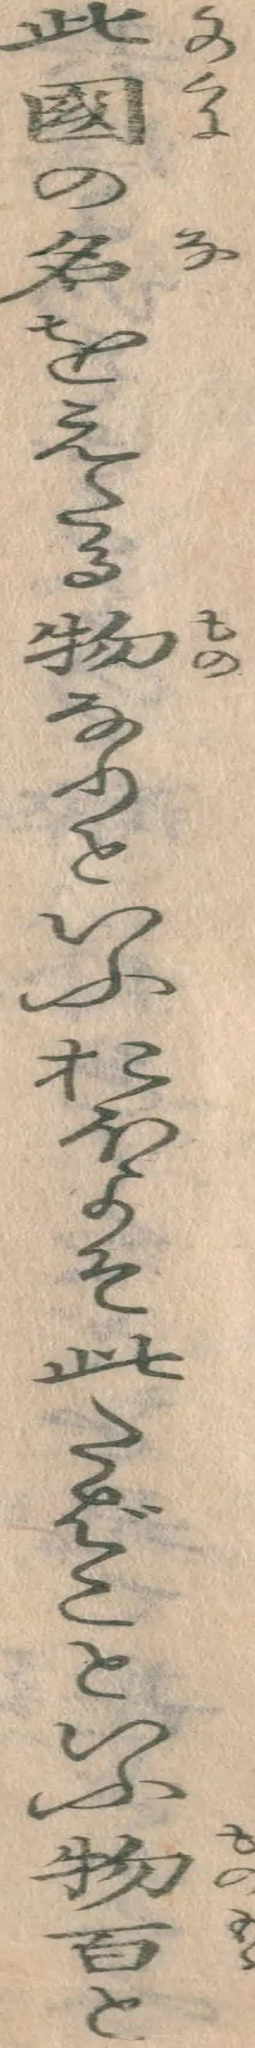此国の名をえたる物なりといふおほよそ此たばこといふ物百と
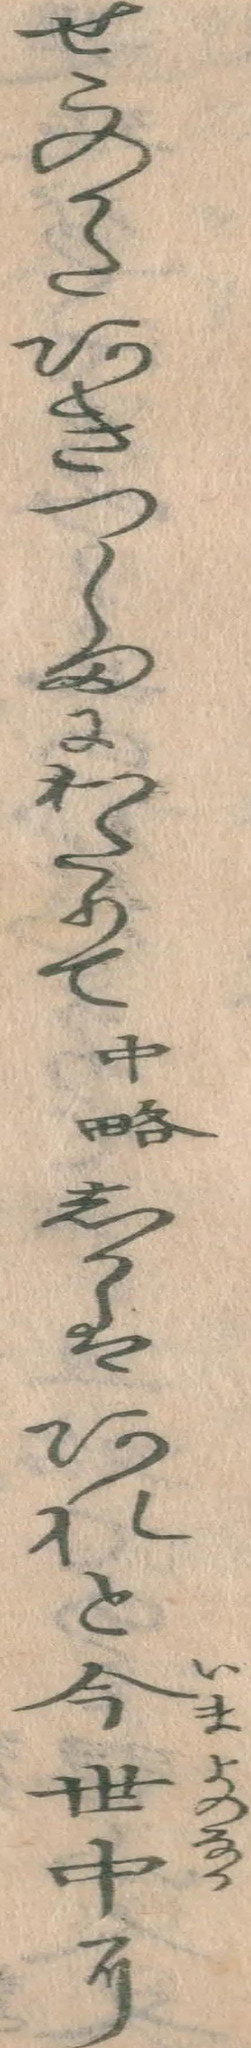せこのかたあきつしまにわたりて中略しくはあれと今世中に
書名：目さまし草
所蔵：国立国会図書館 National Diet Library, JAPAN
